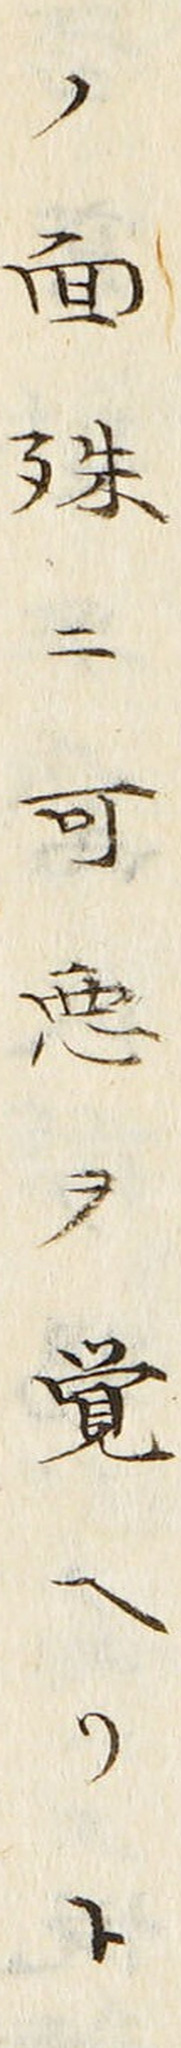ノ面殊ニ可悪ヲ覚ヘリト
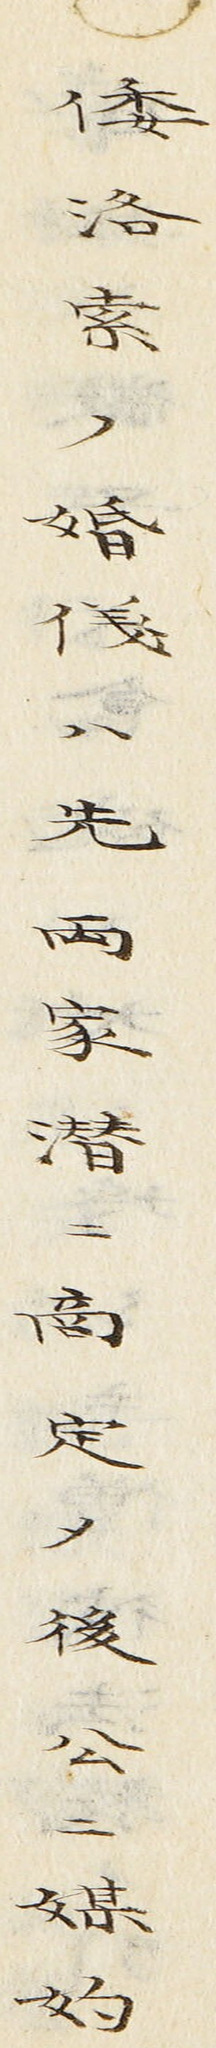〇倭洛索ノ婚儀ハ先両家潜ニ商定シテ後公ニ媒酌
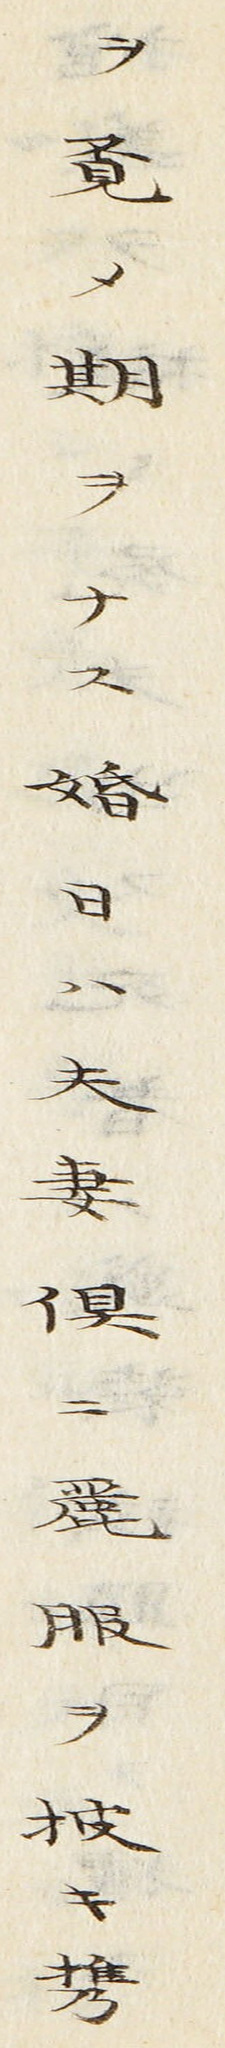ヲ覔メ期ヲナス婚日ハ夫妻倶ニ麗服ヲ披キ携
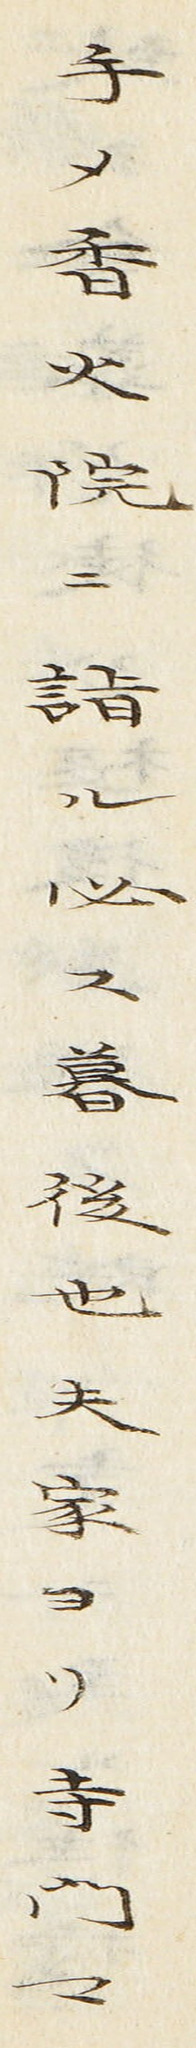手シテ香火院ニ詣ル必ス暮後也夫家ヨリ寺門マ
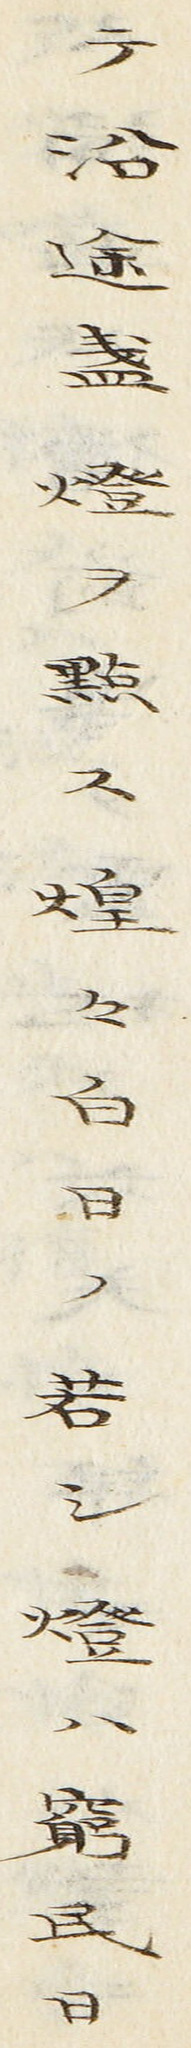テ沿途盞灯ヲ点ス煌々白日ノ若シ灯ハ窮民日
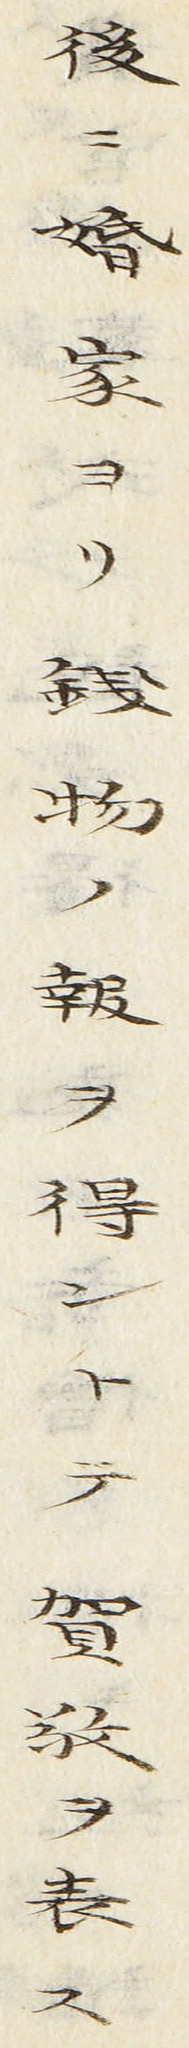後ニ婚家ヨリ銭物ノ報ヲ得ントテ賀敬ヲ表ス
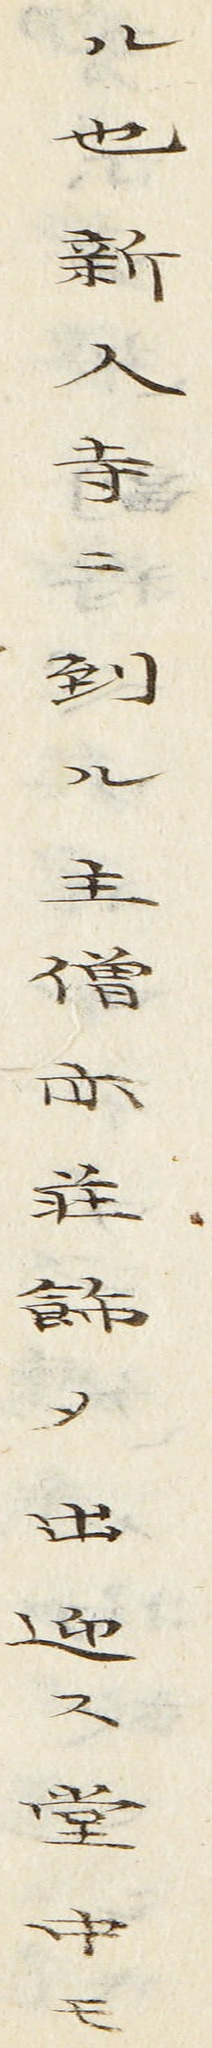ル也新人寺ニ到ル主僧亦荘飾シテ出迎ス堂中モ
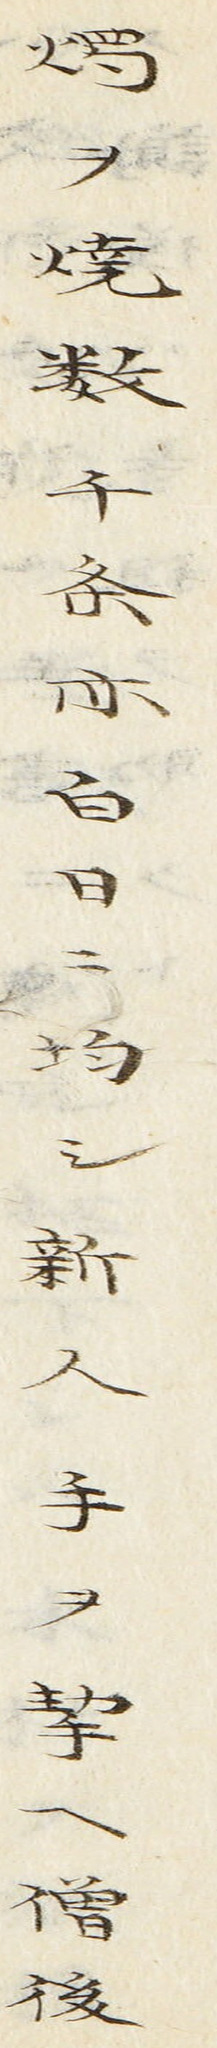燭ヲ焼数千条余亦ｈ白日ニ均シ新人手ヲ挈ヘ僧後
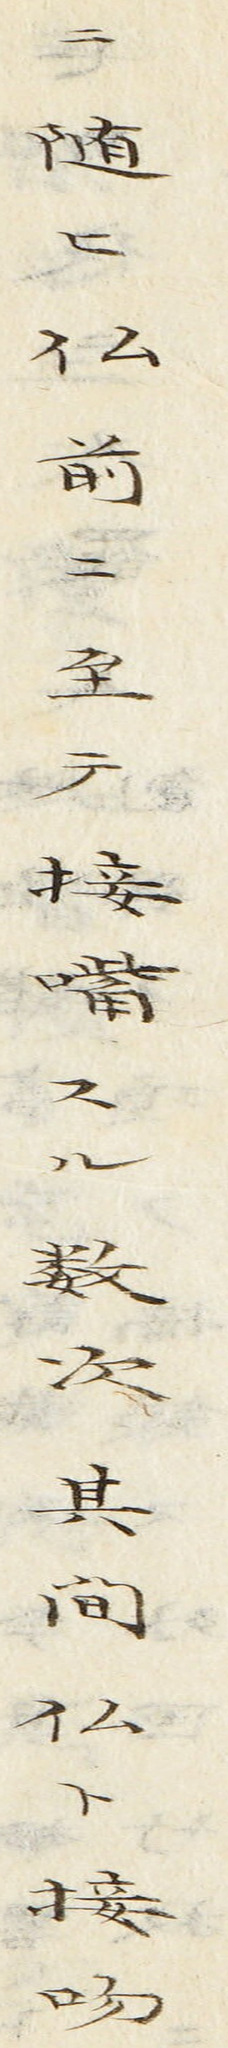ニ随ヒ仏前ニ至テ接嘴スル数次其間仏ト接吻
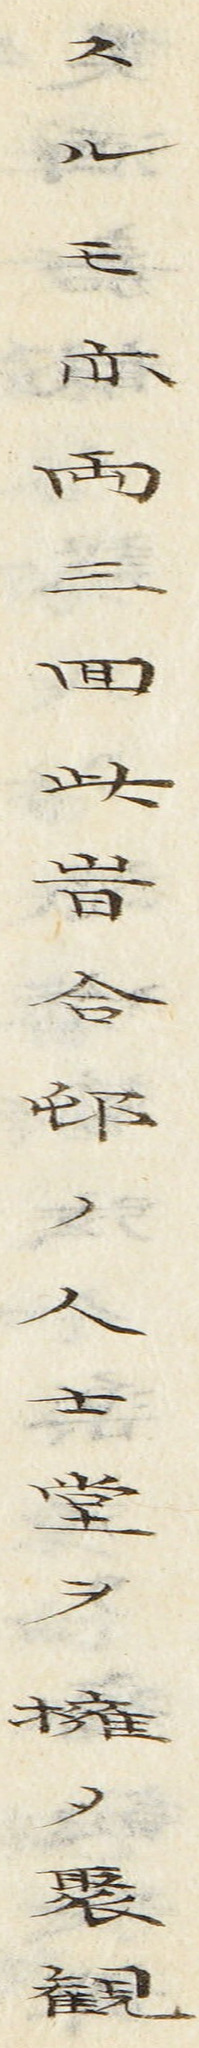スルモ亦両三回此時合邨ノ人士堂ヲ擁シテ聚観
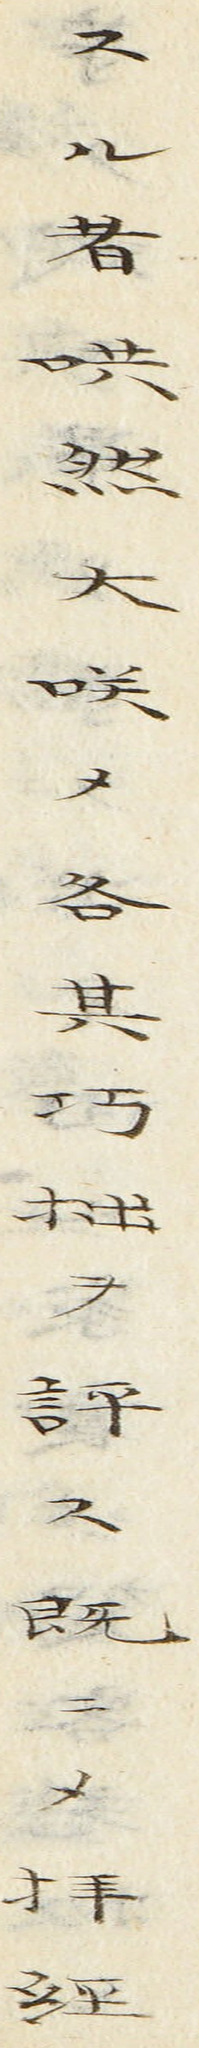スル者哄然大咲シテ各其巧拙ヲ評ス既ニシテ拝経

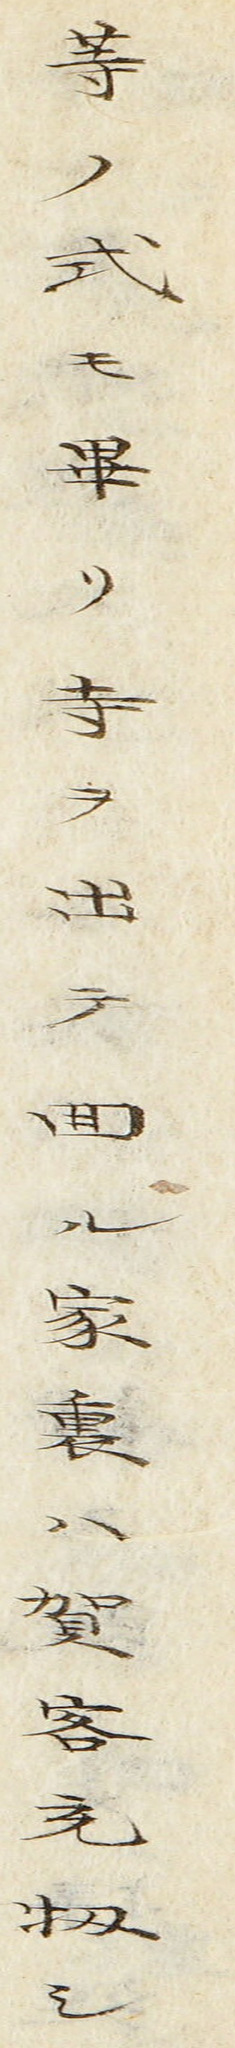等ノ式モ畢リ寺ヲ出テ回ル家裏ハ賀客充牣？シ
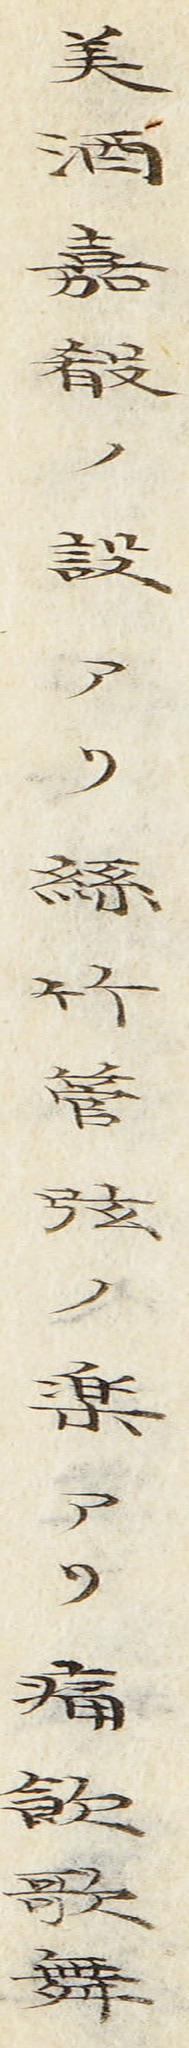美酒嘉殽ノ設アリ竹管弦ノ楽アリ痛飲歌舞
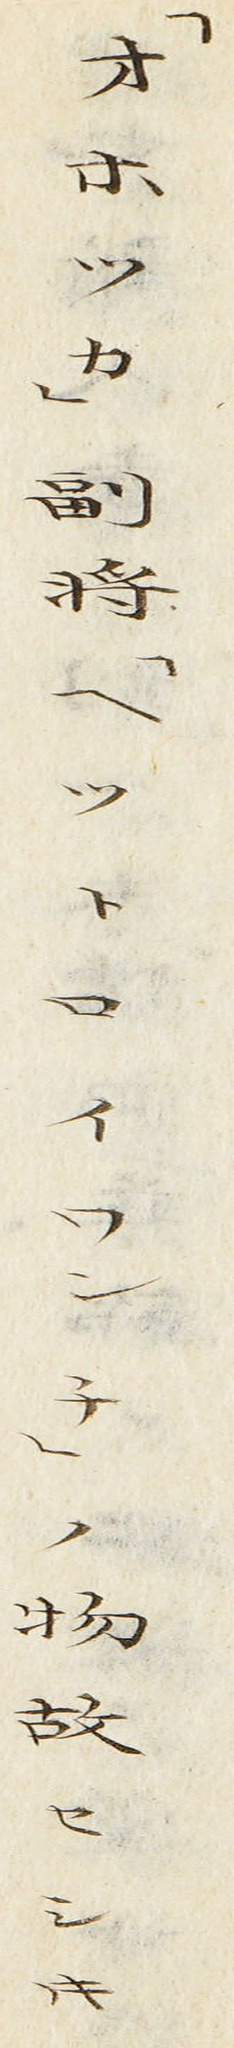〇「オホツカ」副将「ヘツトロイワンネ」ノ物故セシトキ
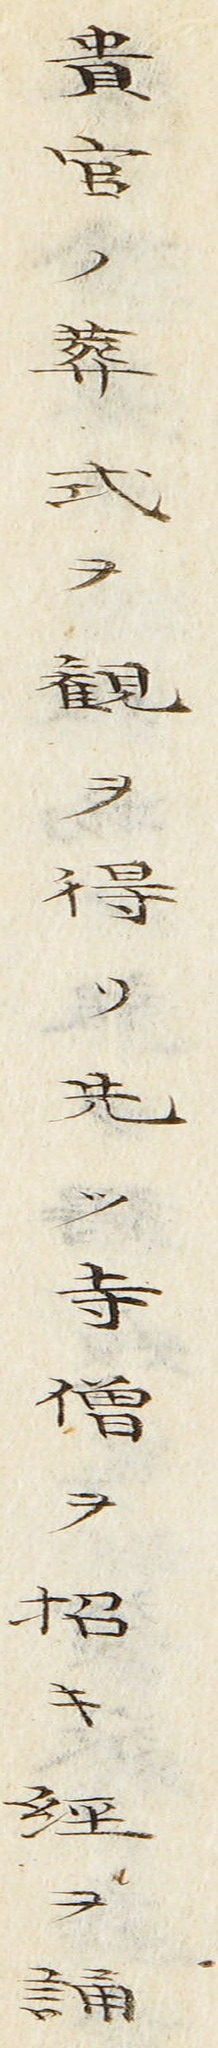貴官ノ葬式ヲ観ヲ得リ先ツ寺僧ヲ招キ経ヲ誦
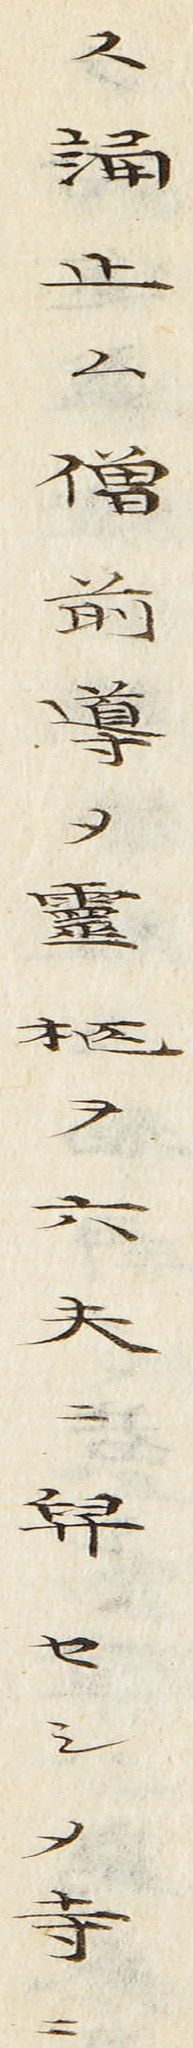ス誦止ム僧前導シテ霊柩ヲ六夫ニ舁セシメ寺ニ
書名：蕃談
